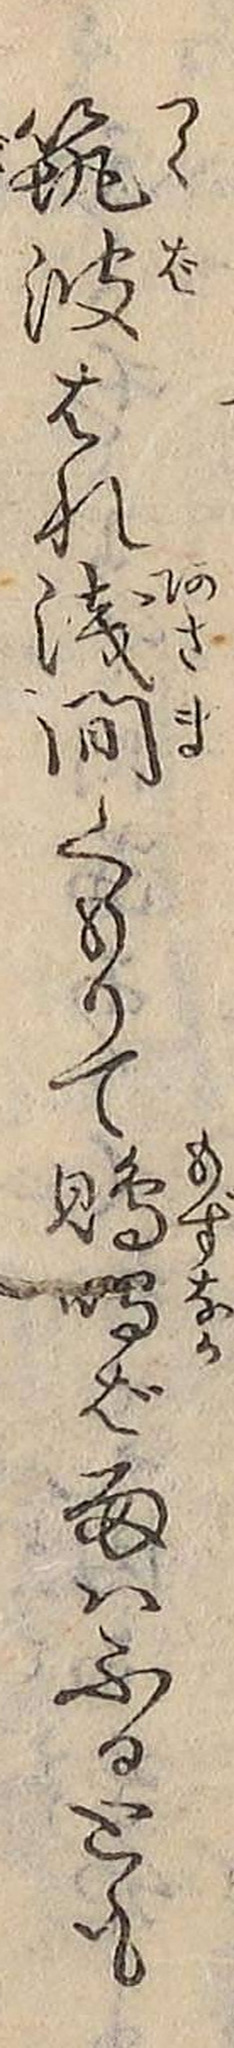筑波はれ浅間くもりて鵙鳴ば雨はふるとも
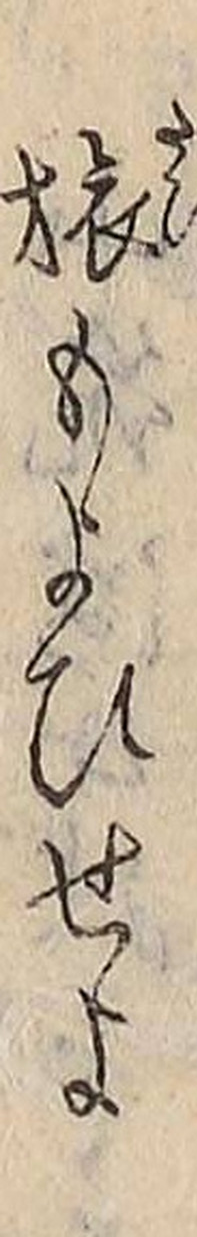旅もよひせよ
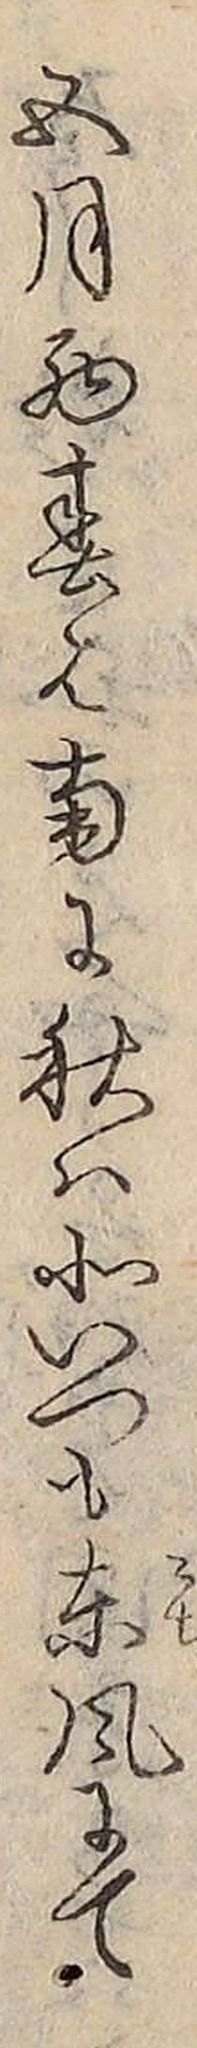五月西春は南に秋は北いつも東風にて
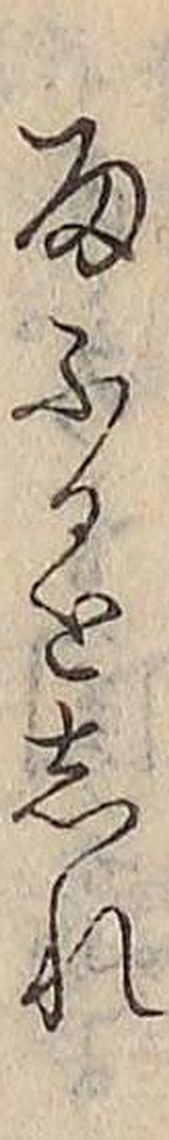雨ふるとしれ
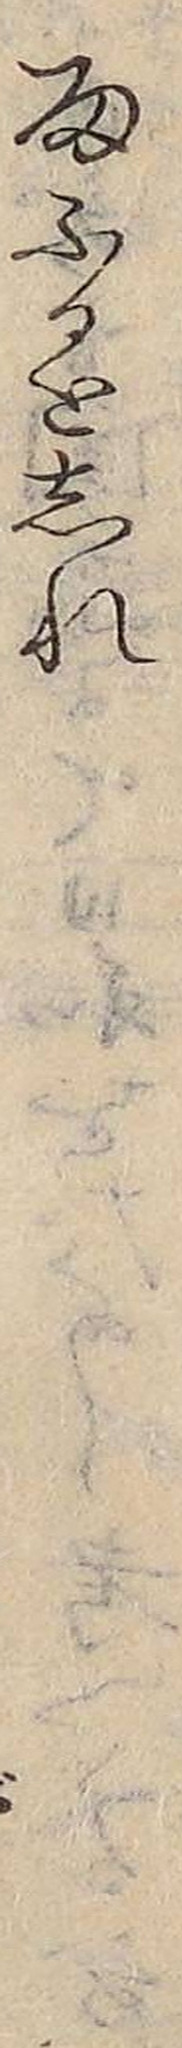雨ふるとしれ
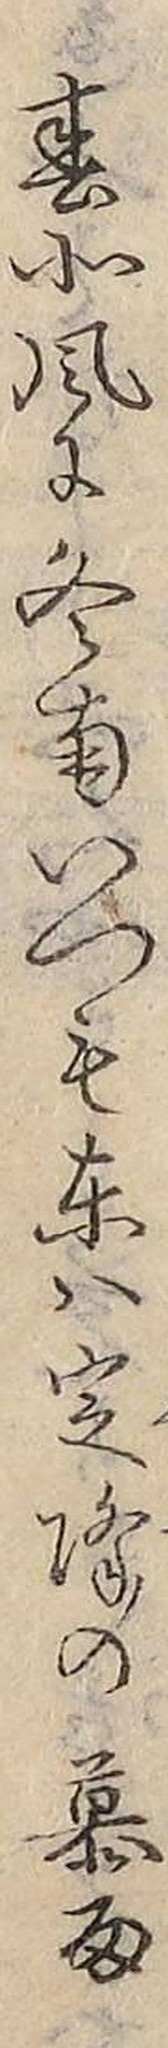春北風に冬南いつも東は定降の慕雨
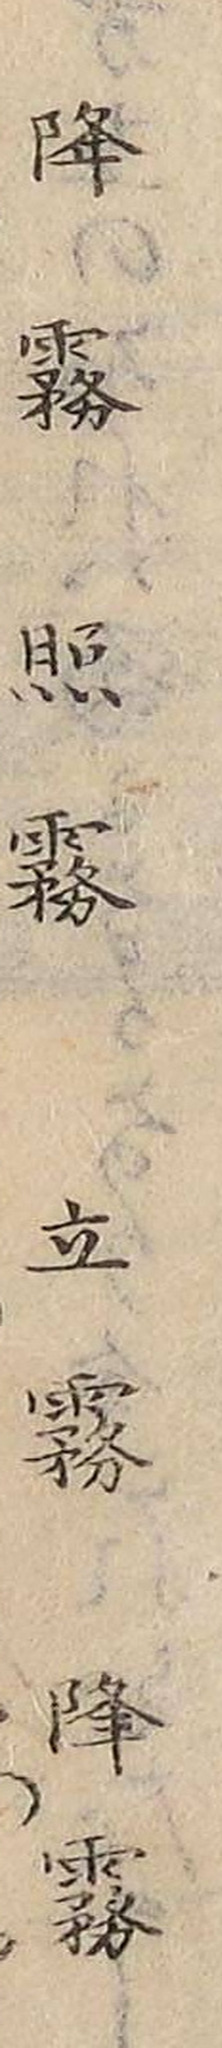降霧照霧立霧降霧
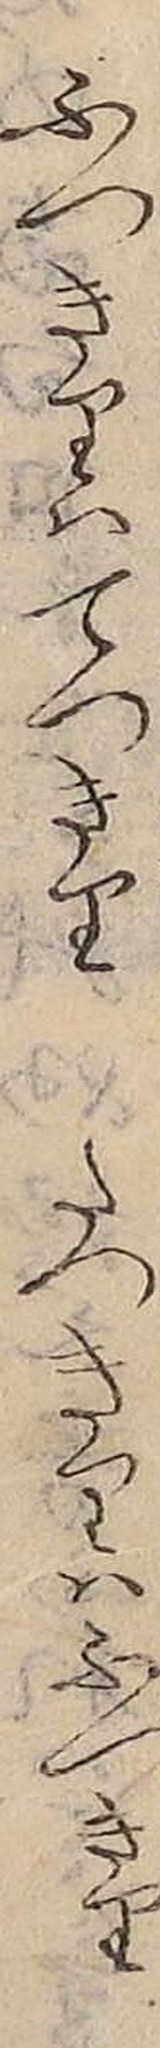ふつきりはてつきりたつきりはふつきり

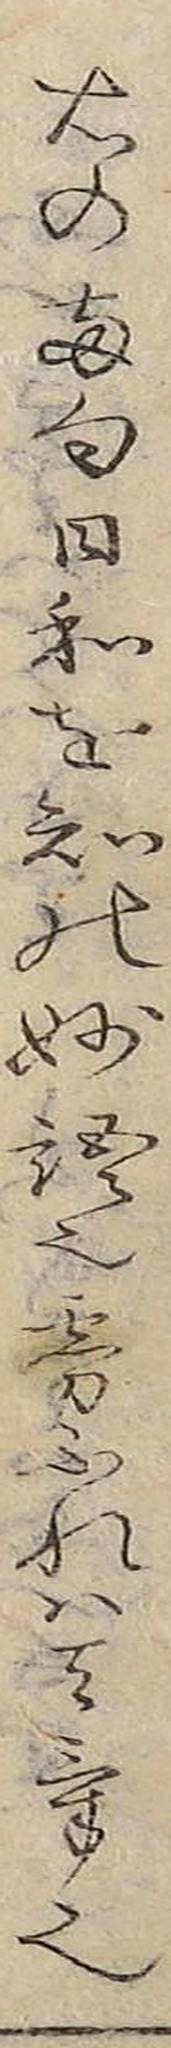右の両句日和を知の妙語也霧ふれは天気也
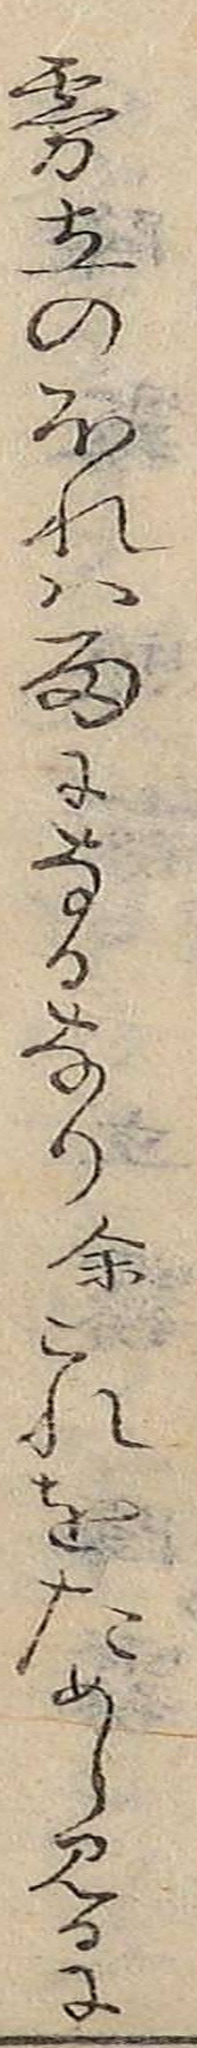霧立のほれは雨になるなり余これをためし見るに
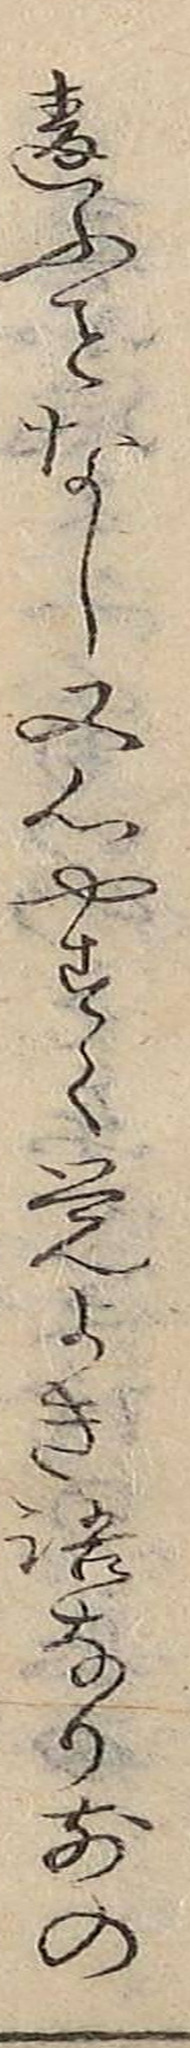違ふことなし又心やすく覚よき語なり前の
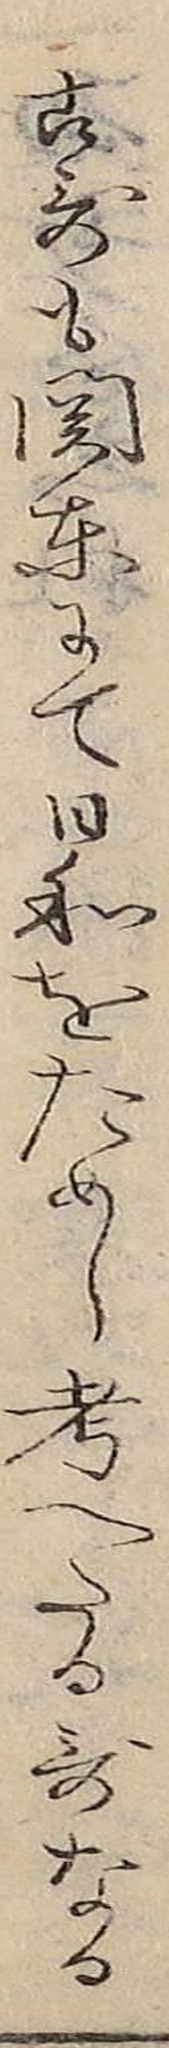古歌も関東にて日和をためし考へたる歌なる
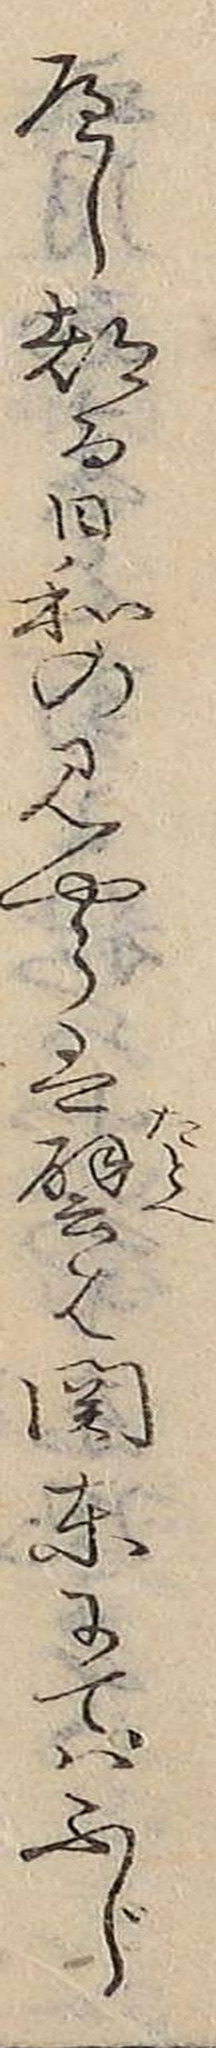へし都而日和の見やうは譬は関東にてはふじ
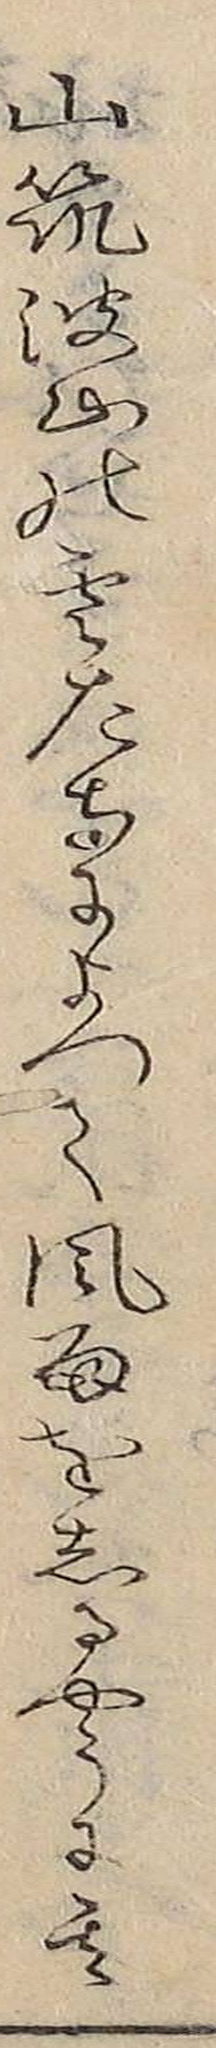山筑波山の雲たちによつて風雨をしるやうに其
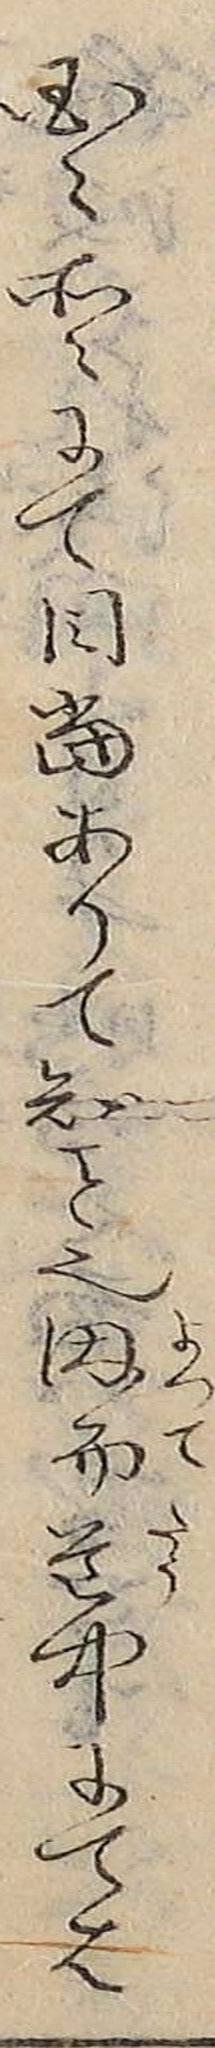国々所々にて目当ありて知こと也因而道中にては
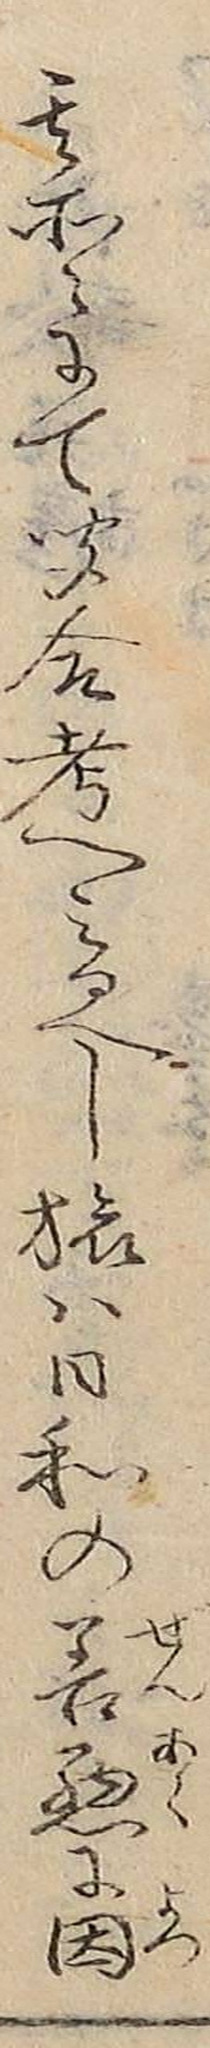其所々にて聞合考へみるへし旅は日和の善悪に因
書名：旅行用心集
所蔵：神戸大学附属図書館 国文学研究資料館
